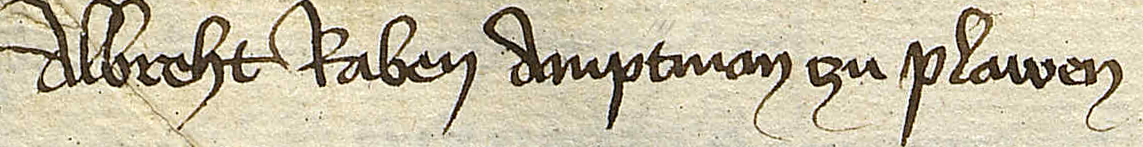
Albreht Raben Amptman cʒu plawen
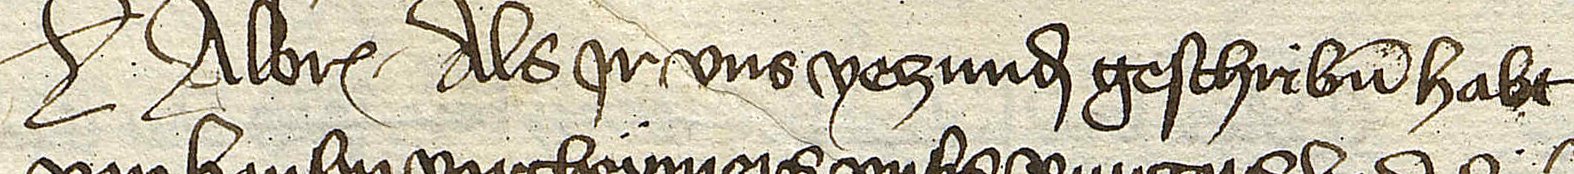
L* Albr* / Als Ir vns yecʒund* geſchrib*n habt
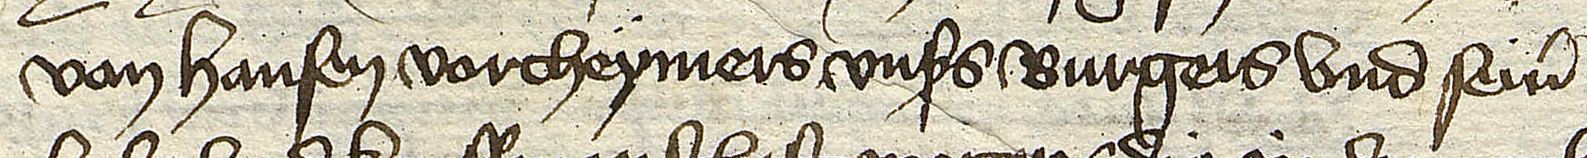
von hanſen vorcheymers vnſ*s Burgers vnd ſein*
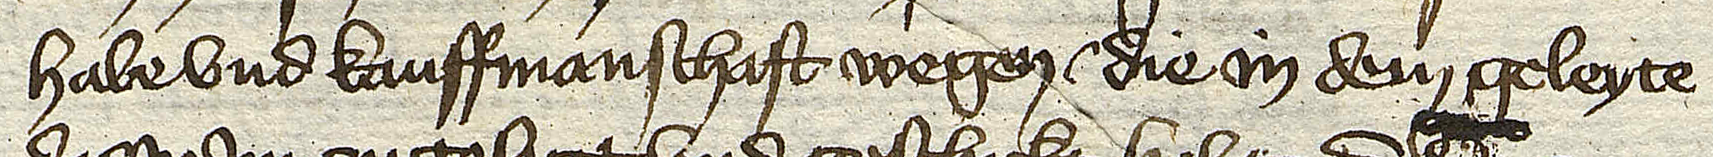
habe vnd kauffmanſchaft wegen / die in dem geleyte
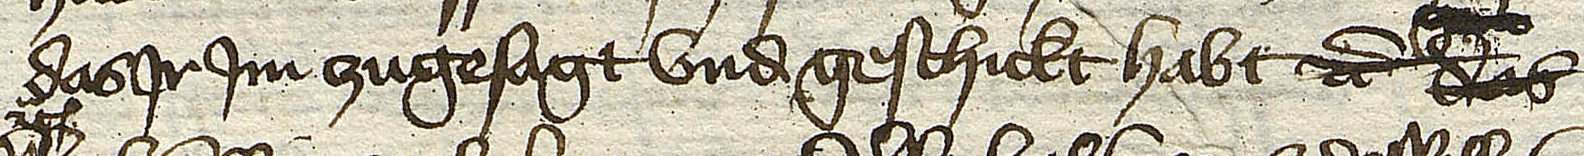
das Ir Im cʒugeſagt vnd geſchickt habt ec* das
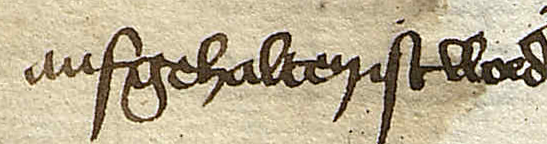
aufgehalten iſt word*
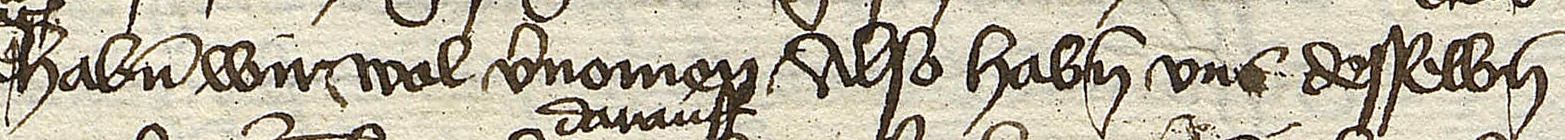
hab*n wir wol v*nomen / Alſo hab*n vns deſſelb*n
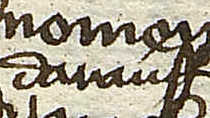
darauff
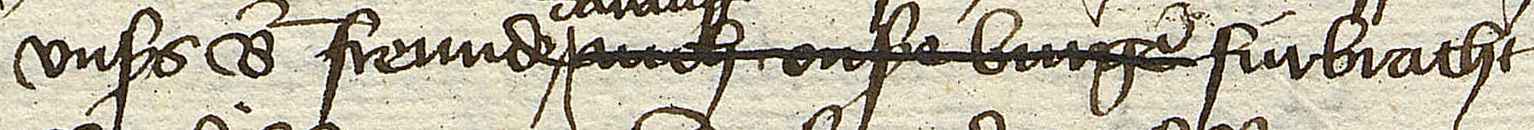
vnſ*s B* freunde auch vnſ*e burge* fürbracht
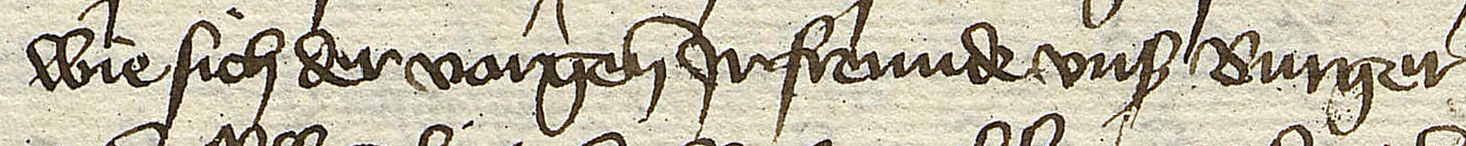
wie ſich der vorgen* Ir freunde vnſ* Burger
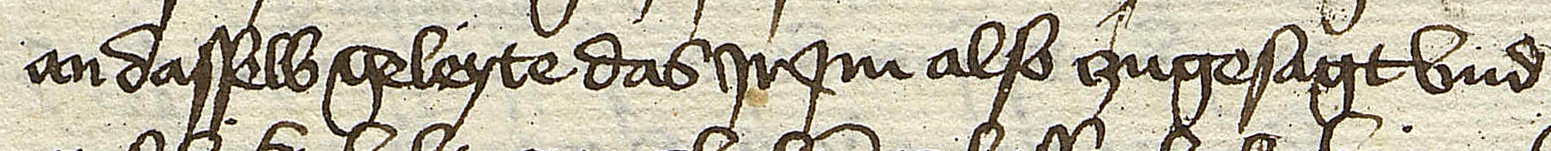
an daſſelb geleyte das Ir Im alſo cʒugeſagt vnd
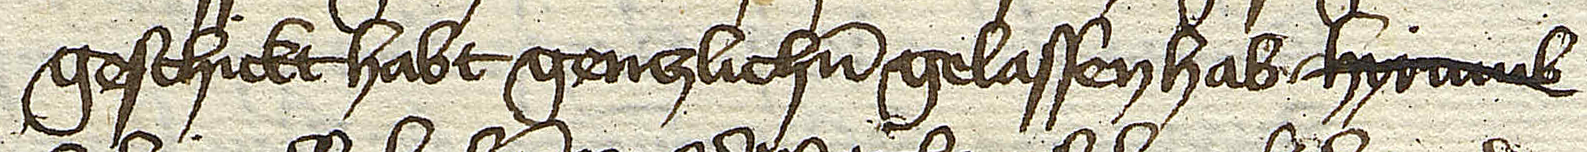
geſchickt habt gencʒlich*n gelaſſen hab / hyrümb
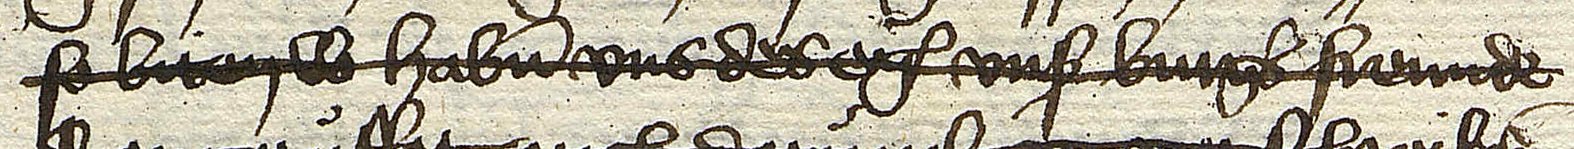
ſo biten w hab*n vns des eg* vnſ*s burg*s freunde
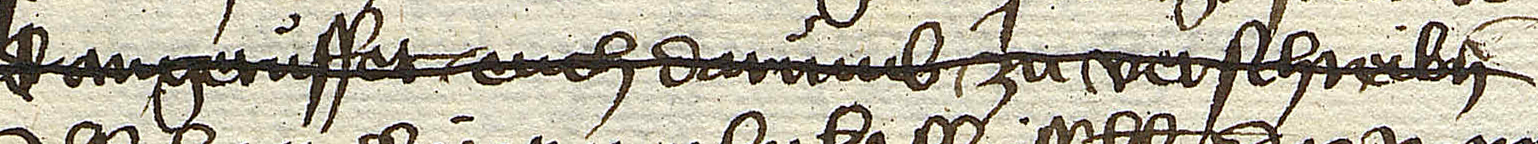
d angerüffet / euch darümb cʒu verſchreib*n
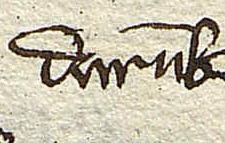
daru*b
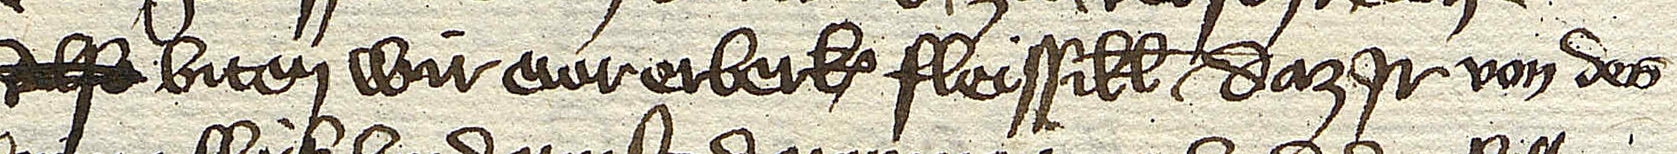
Alſo biten wir ewr erberk* fleiſſikl* / daʒ Ir von des
